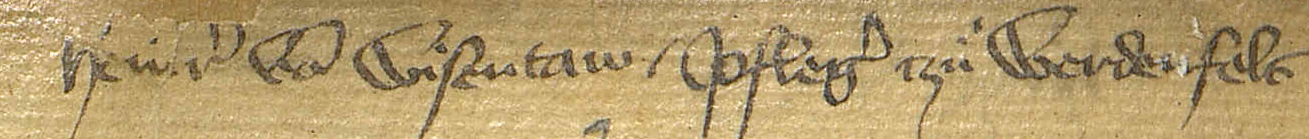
heinr* vo* Wiſentaw / Pfleg* cʒü Werdenfels
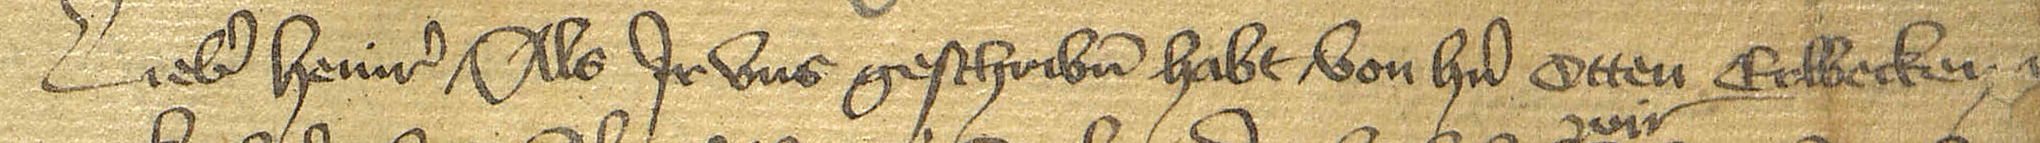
Lieb* heinr* / Als Ir vns geſchribn* habt / von hn* Otten Erlbecken
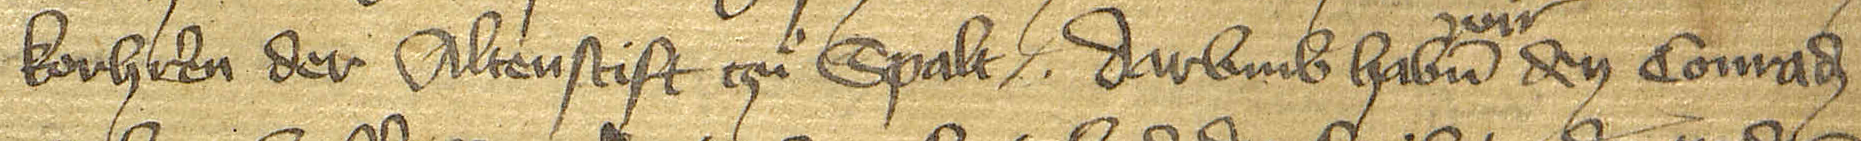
korhr*n der Altenſtift cʒü Spalt / . Darvmb habn* den Conrad*
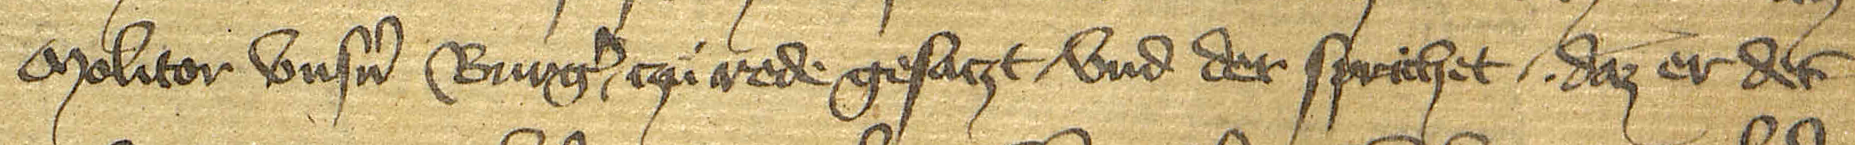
Molitor vnſn* Burg* / cʒü rede geſacʒt / vnd der ſprichet / . daʒ er des
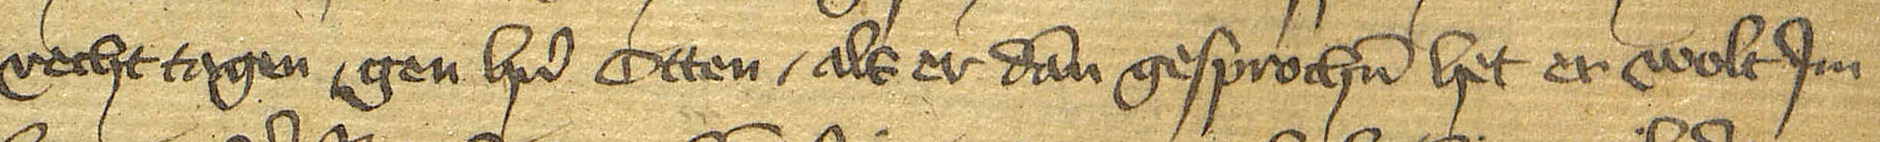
recht tagen / gen hn* Otten / als er dan* geſprochn* het er wolt Im
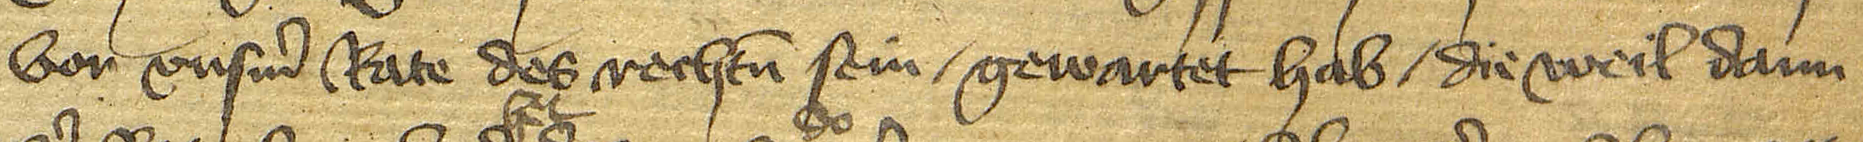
vor vnſm* Rate des rechtn* ſein / gewartet hab / die weil dann
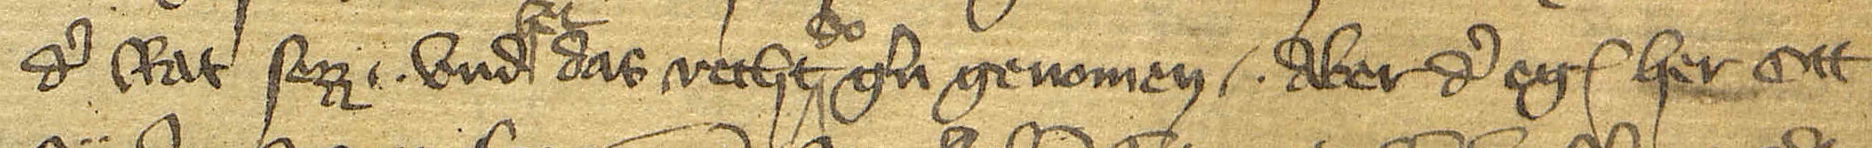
d* Rat ſeʒʒ / . vnd das recht g*n genomen / . Aber d* eg* her Ott
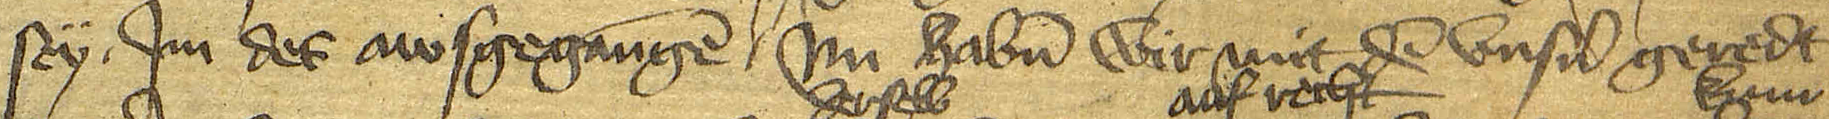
ſey / Im des awſgegange* / Nu habn* wir mit d* vnſn* geredt
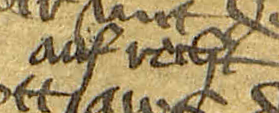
auf recht
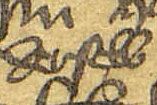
derſelb
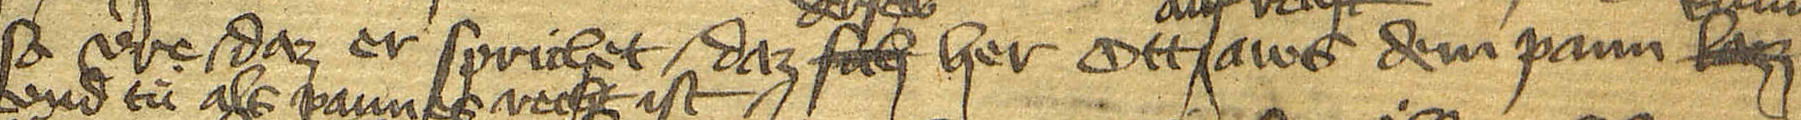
ſo v*re / daʒ er ſprichet / daʒ ſich her Ott aws dem pann laʒʒ
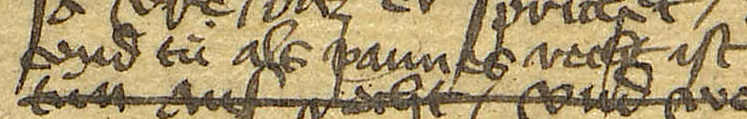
vnd tü als pannes recht iſt
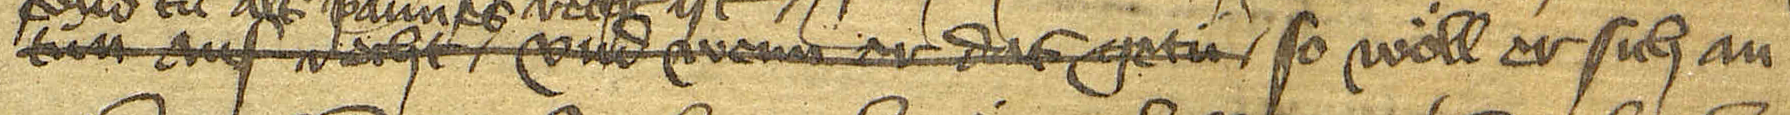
tün auf recht / vnd wenn er das getü / ſo wöll er ſich an
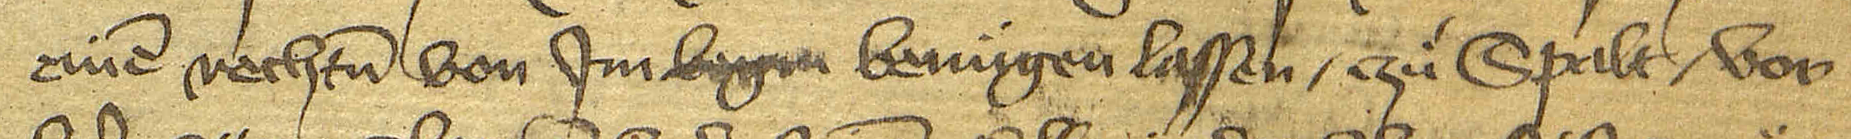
eine* rechtn* von Im begn benügen laſſen / cʒü Salt / vor
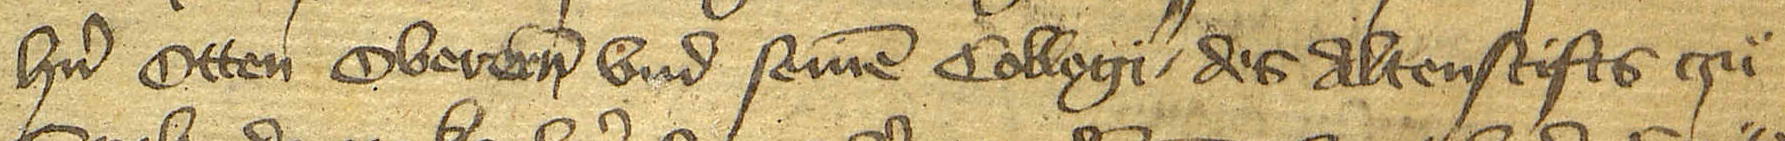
hn* Otten Oberern* vnd ſeine* Collegi / des Altenſtifts cʒü
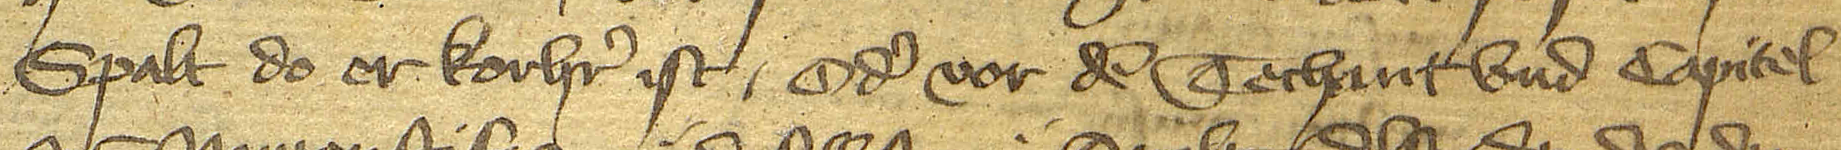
Spalt do er korhr* iſt / Od* vor d* Techant vnd Capitel
